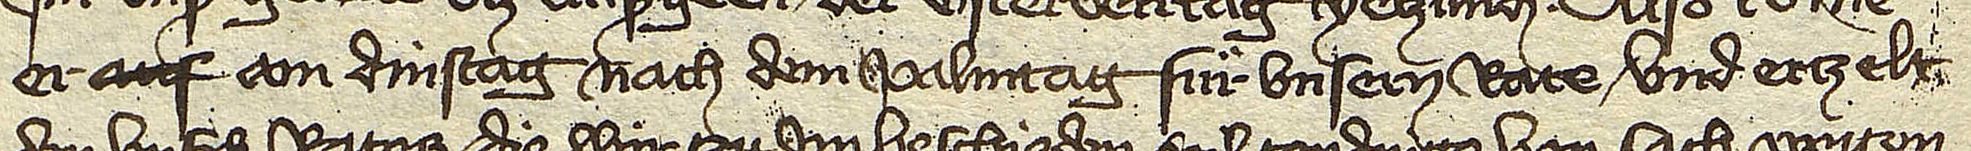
er auf am dinſtag nach dem Palmtag für vnſern Rate / vnd ercʒelt
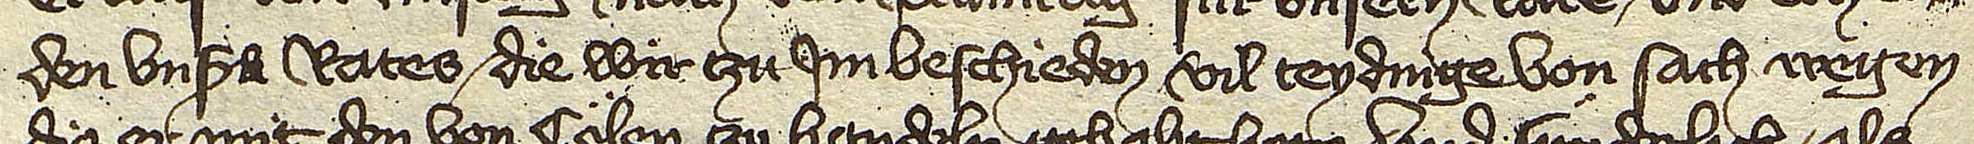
den vnſ*s Rates / die wir cʒu Im beſchieden / vil teydinge von ſach wegen
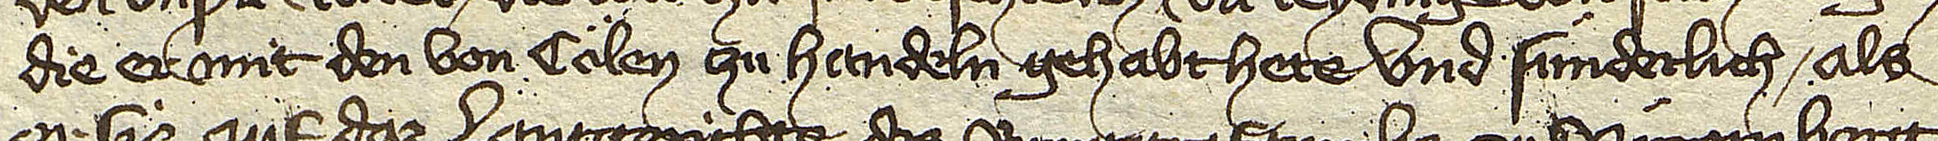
die er mit dne von Cölen cʒu handeln gehabt hete vnd ſünderlich / als
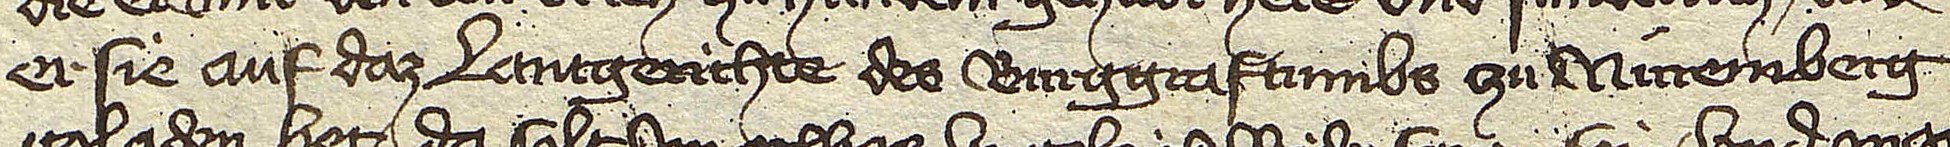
er ſie auf daʒ Lantgerichte des Burggraftumbs cʒu Nüremberg
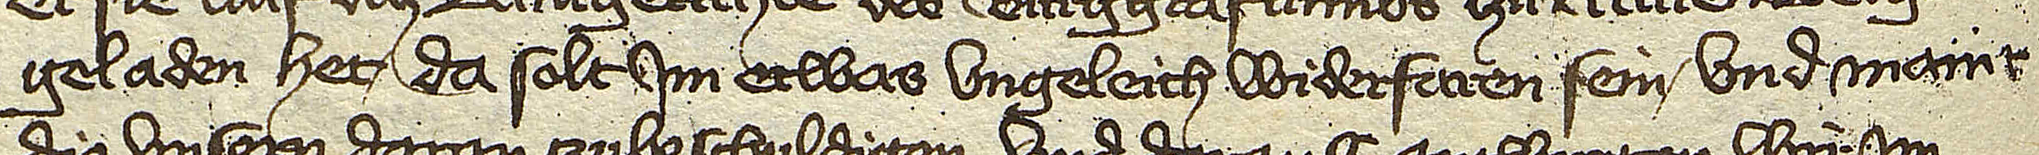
geladen het / da ſolt Im etwas vngeleich widerfaren ſein / vnd maint
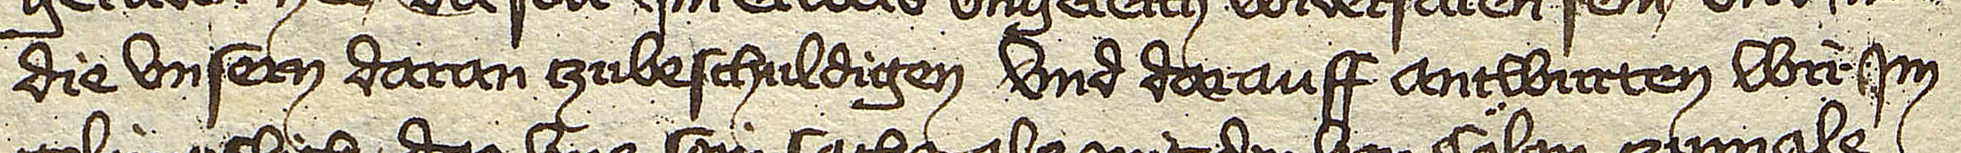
die vnſern daran cʒubeſchuldigen vnd darauff antwurten wir Im
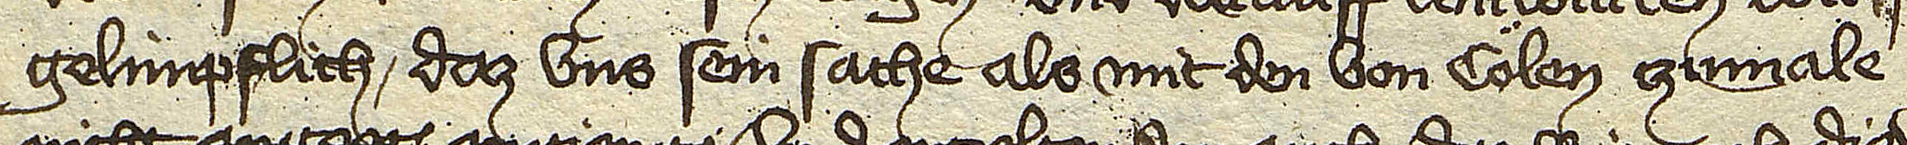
gelimpflich / daʒ vns ſein ſache als mit den von Cölen cʒumale
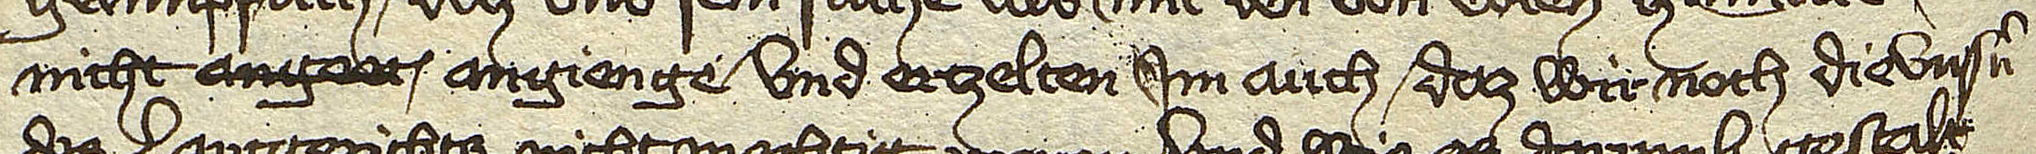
nicht angeet / angienge / vnd ercʒelten Im auch / daʒ wir noch die vnſn*
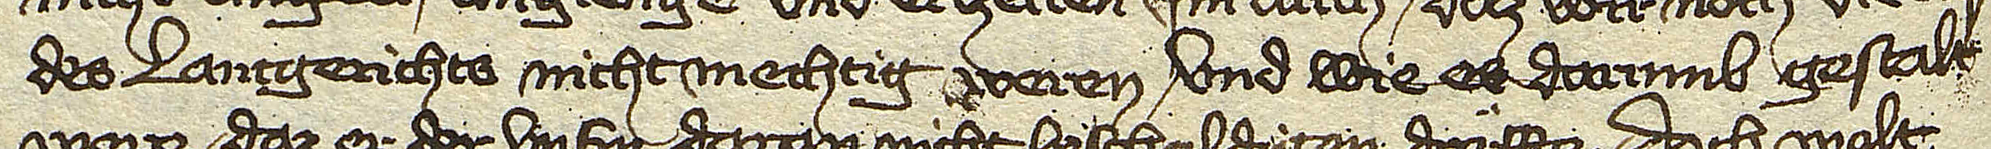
des Lantgerichts nicht mechtig weren / vnd wie es darumb geſtalt
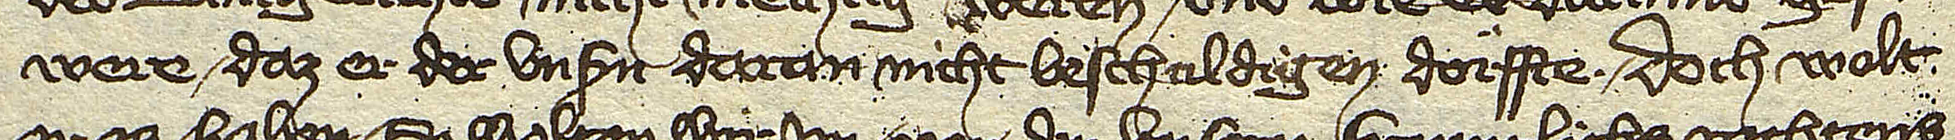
were / daʒ er der vnſ*n daran nicht beſchuldigen dörffte . / Doch wolt
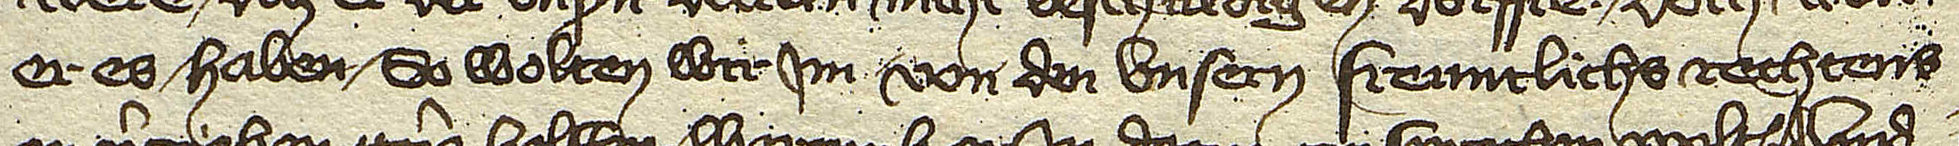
er es / haben / So wolten wir Im von den vnſern freuntlichs rechtens
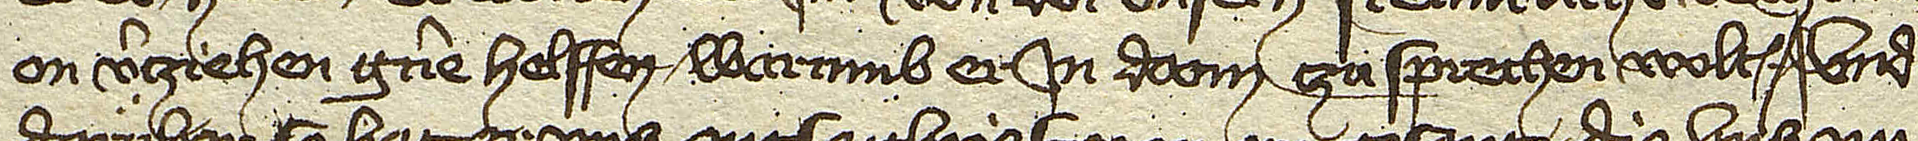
on v*cʒiehen g*ne helffen / warumb er In dann cʒu ſprechen wolt* / Vnd
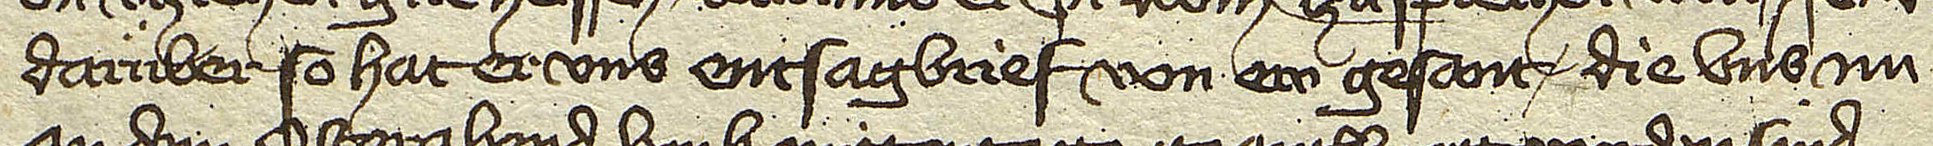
darüber ſo hat er vns entſagbrief von ew geſant / die vns nu
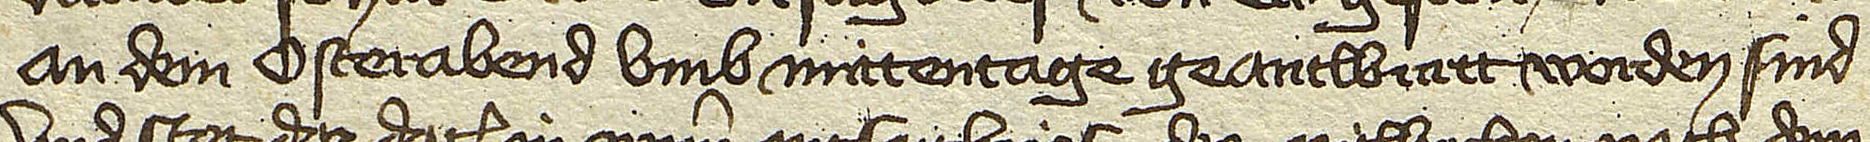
an dem Oſterabend vmb mittentage geantwurtt worden ſind
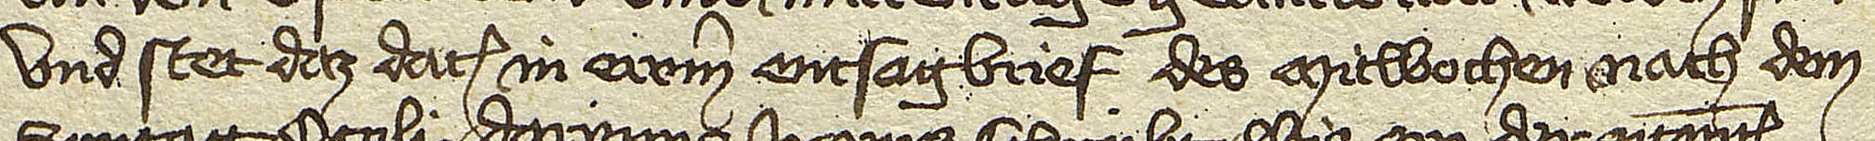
vnd ſtet daʒ dat* in ewrm* entſagbrief des Mitwochen nach dem
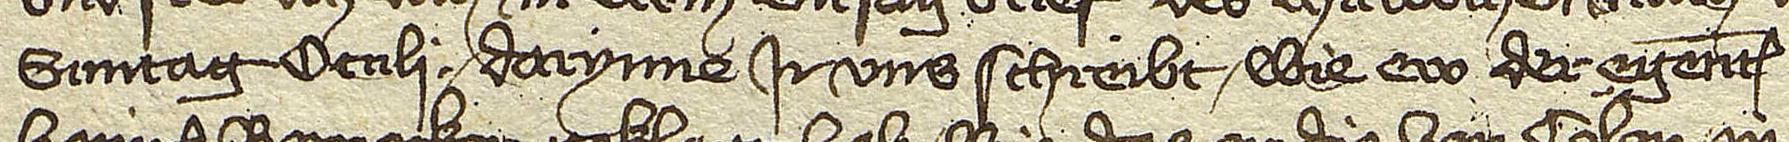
Suntag Oculi . / darynne Ir vns ſchreibt / wie ew der egent*
